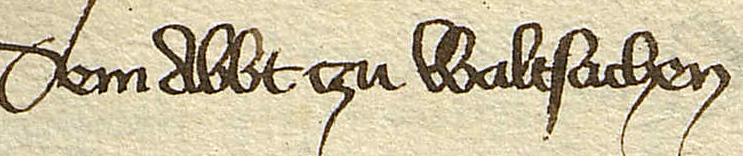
Dem Abbt cʒu Waltſachen
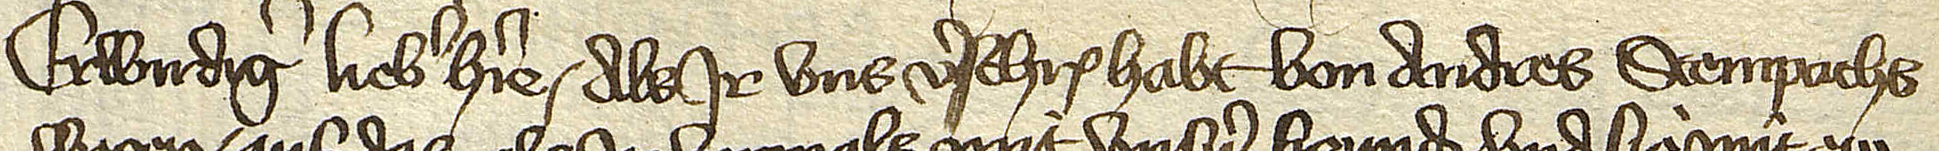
Erwirdig* lieb* h*re / Als Ir vns v*ſchr* habt von Andres Steinpachs
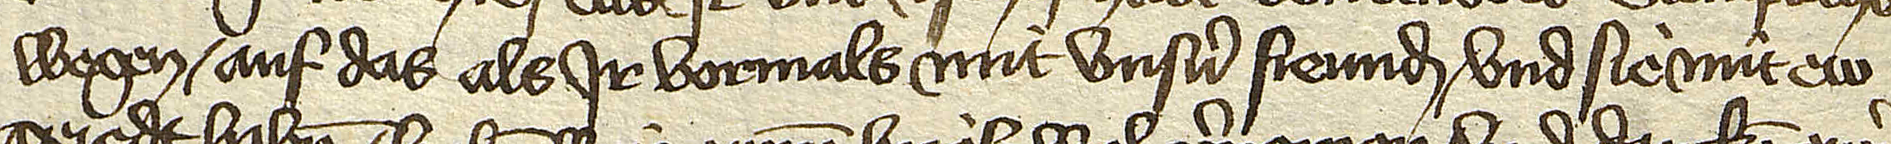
wegen / auf das als Ir vormals mit vnſn* freund* / vnd ſie mit ew
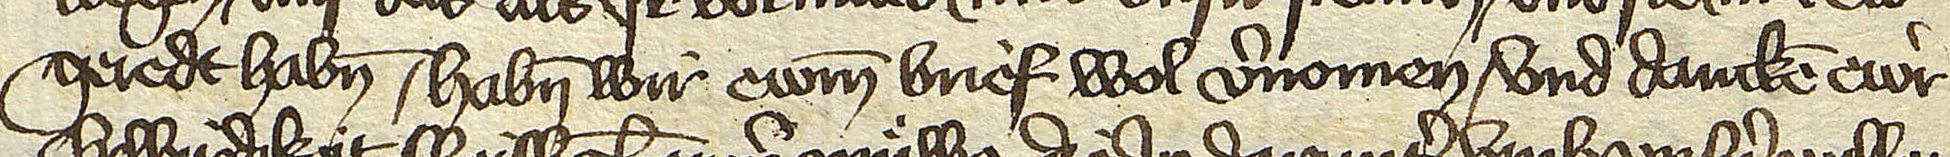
geredt habn* / habn* wir ewrn* brief wol v*nomen / vnd dancke* ewr*
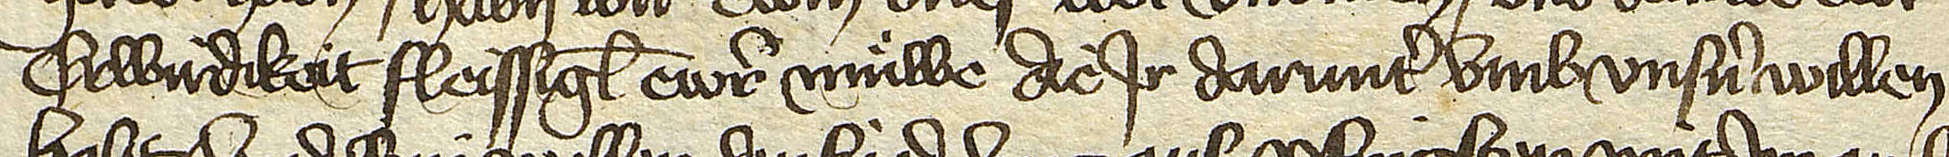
Erwirdikeit fleiſſigl* ewr* müwe die Ir darunt* vmb vnſn* willen
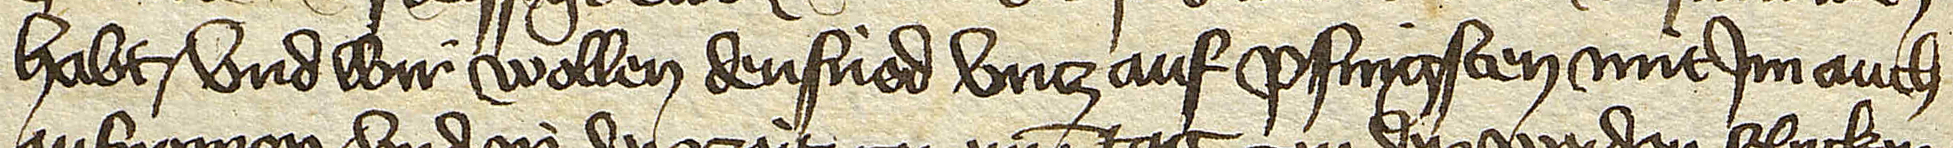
habt / vnd wir wollen den fried vncʒ auf Pfingſten mit Im auch
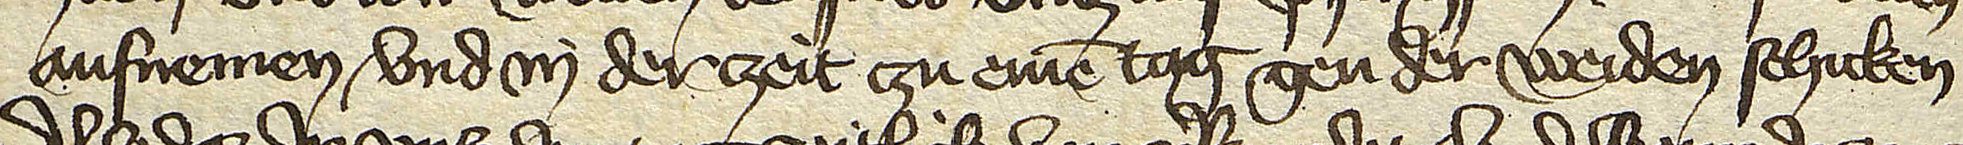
aufnemen / vnd in der cʒeit cʒu eine* tag gen der weiden ſchicken
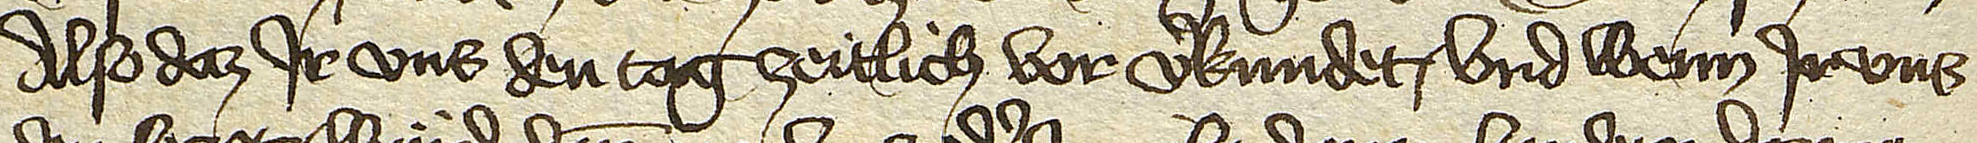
Alſo daʒ Ir vns den tag cʒeitlich vor v*kundet / vnd wenn Ir vns
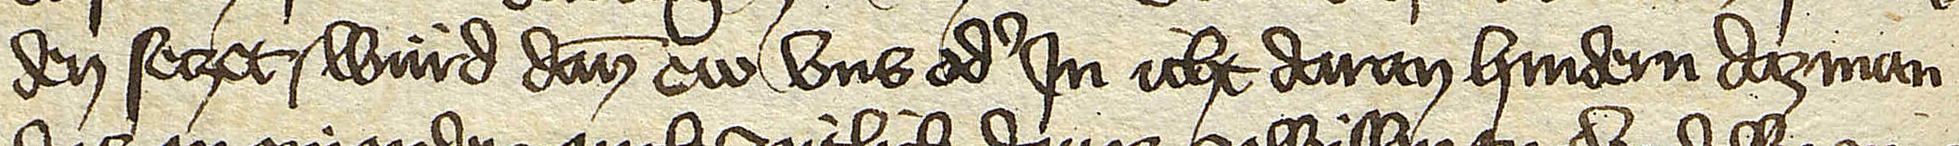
den ſecʒet / würd dan* ew vns od* In icht daran hindern daʒ man
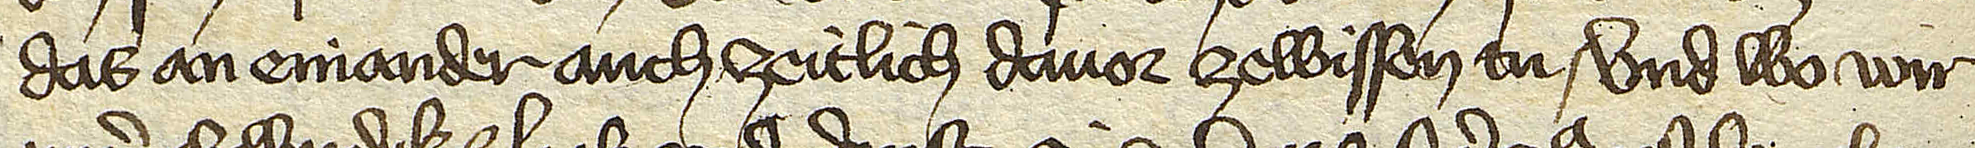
das an einander auch cʒeitlich dauor cʒewiſſen tu / vnd wo wir
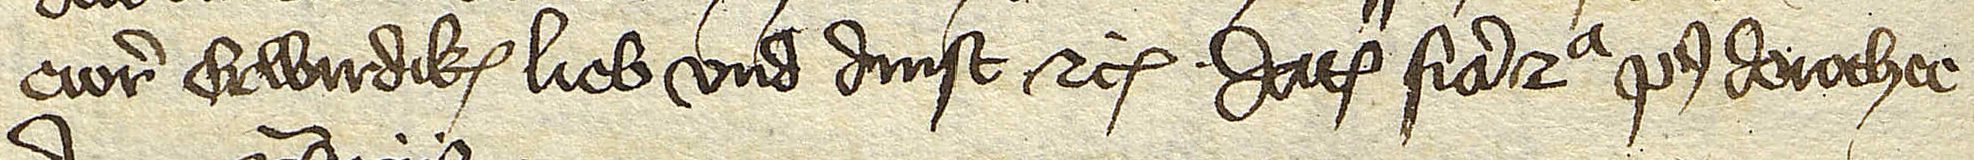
ewr* Erwirdik* lieb vnd dinſt ec* dat* fia* 2* p* dorothee
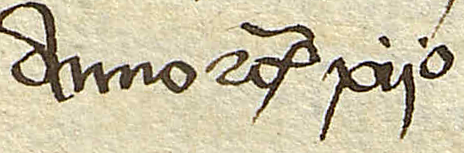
Anno* ec* xii*
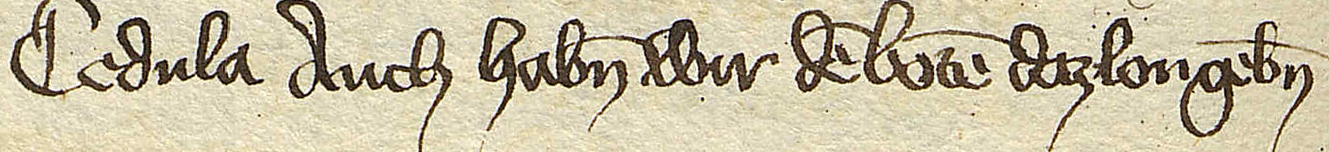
Cedula Auch habn* wir de* bote* daʒ lon gebn*
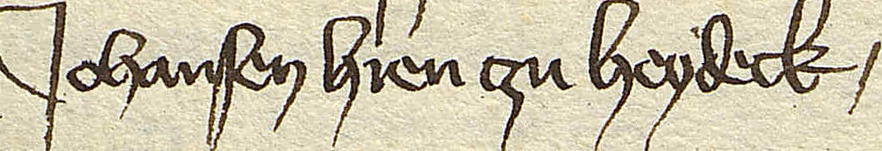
Iohanſen h*ren cʒu heydeck /
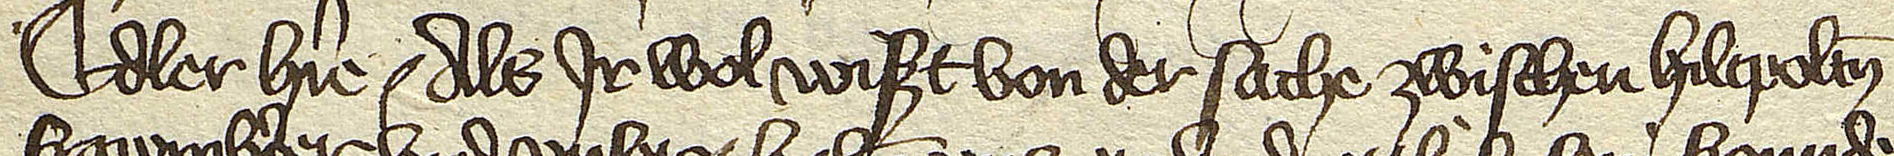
Edler h*re / Als Ir wol wiſʒt von der ſache ʒwiſchen hiltpoltn*
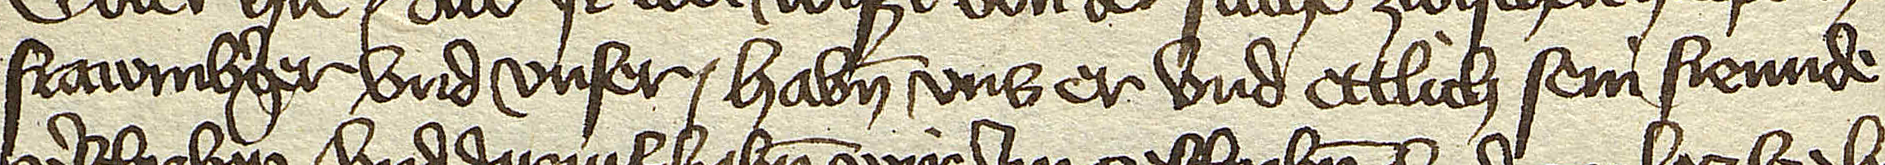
frawmb*ger vnd vnſer / habn* vns er vnd ettlich ſein freunde
